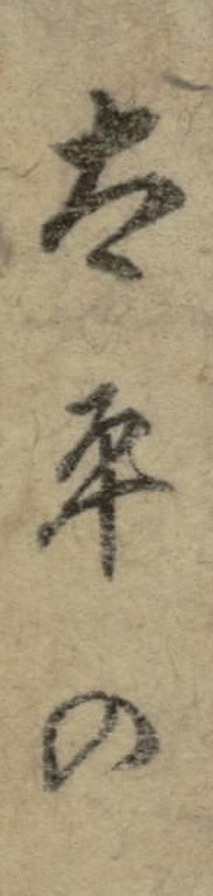太平の
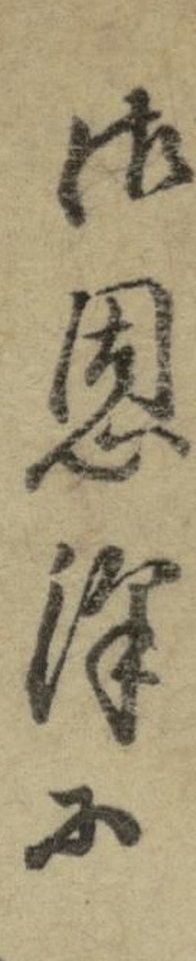御恩沢に
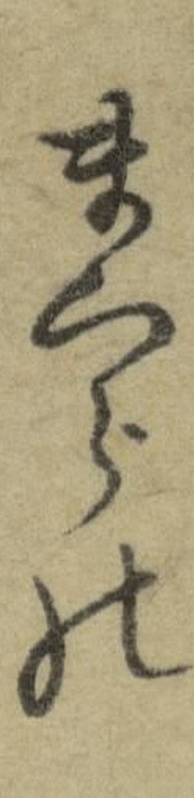まくらの
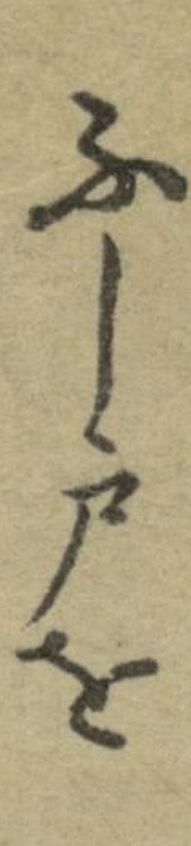ふし戸を
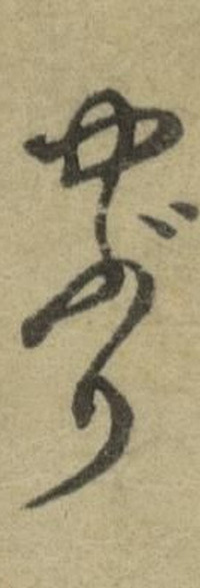やぶり
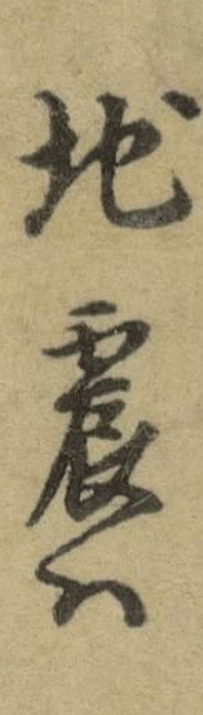地震は
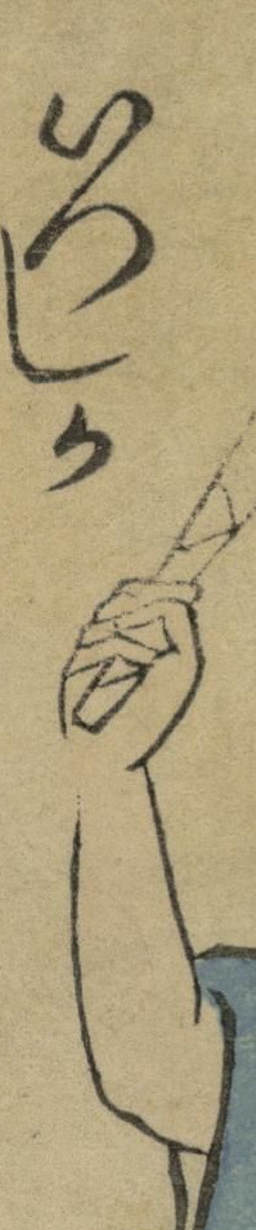いつしか
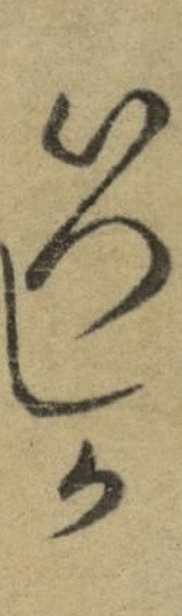いつしか
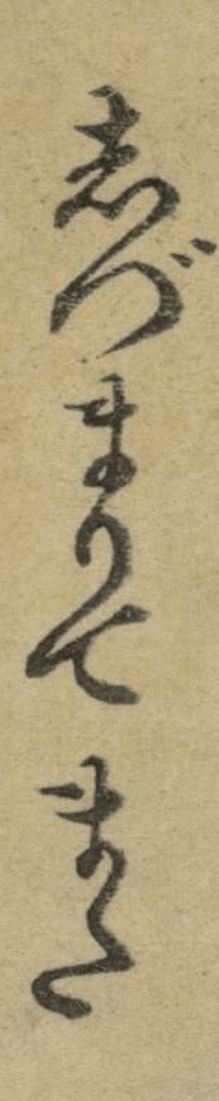しづまりてまた
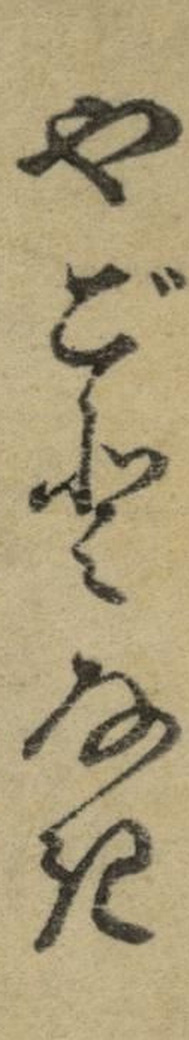やごとなき
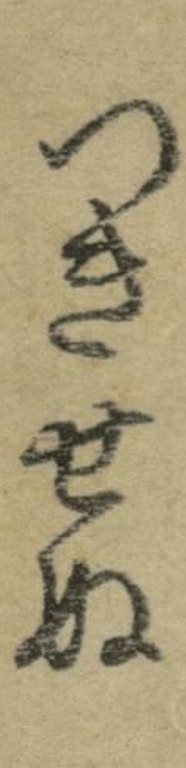つきせぬ
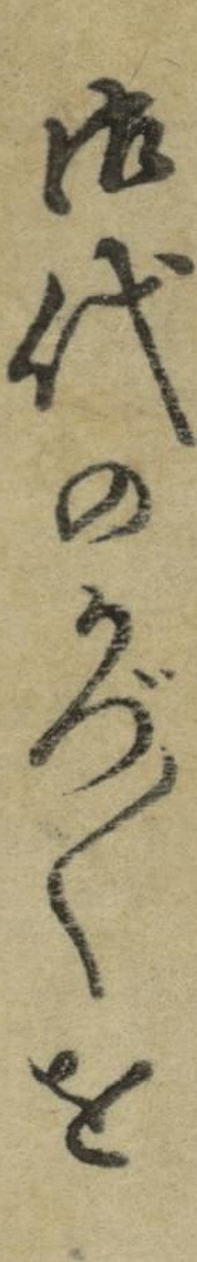御代のかづ〳〵を
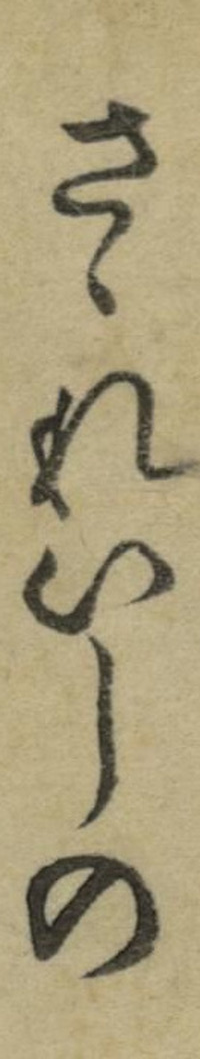さゝれいしの
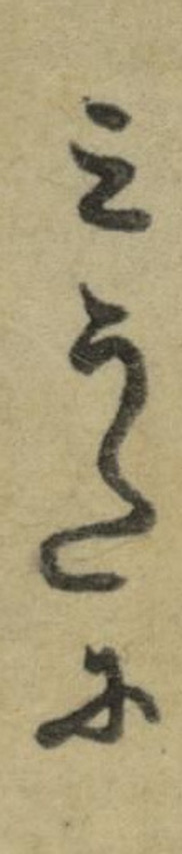みうたに
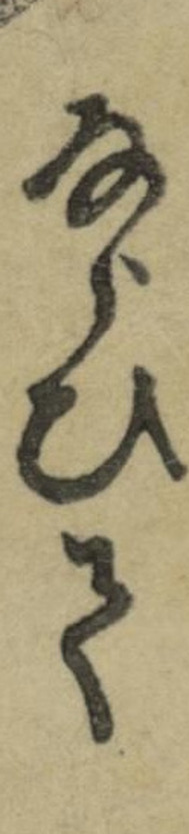ならひて
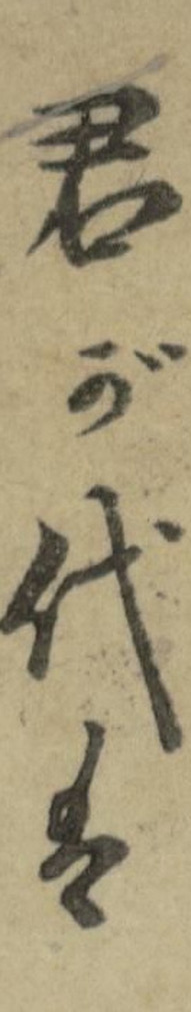君が代は
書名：[太平の御恩澤に]
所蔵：東京大学地震研究所図書室 Earthquake Research Institute Library, The University of Tokyo, JAPAN
